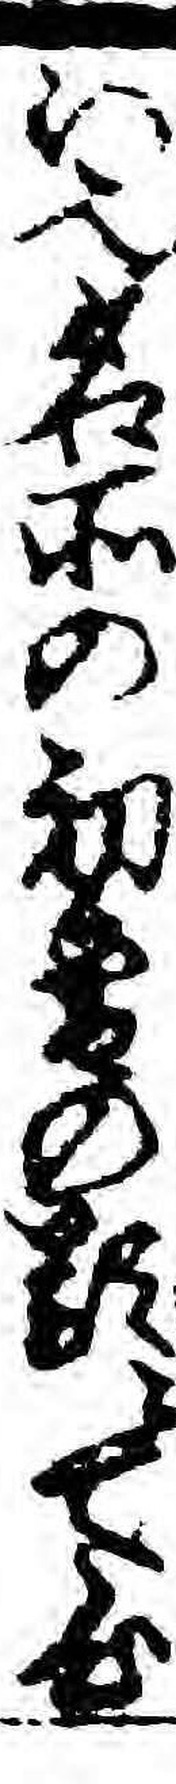い也名所の初雪の題にて心
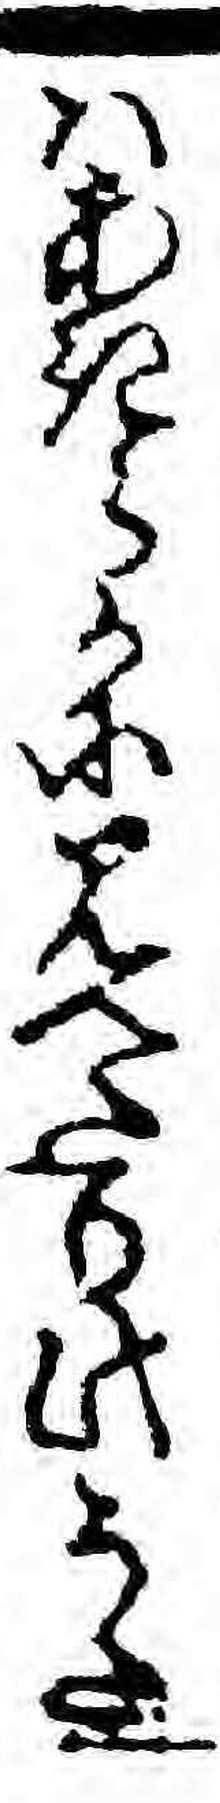はあきらかに見へたり此うた
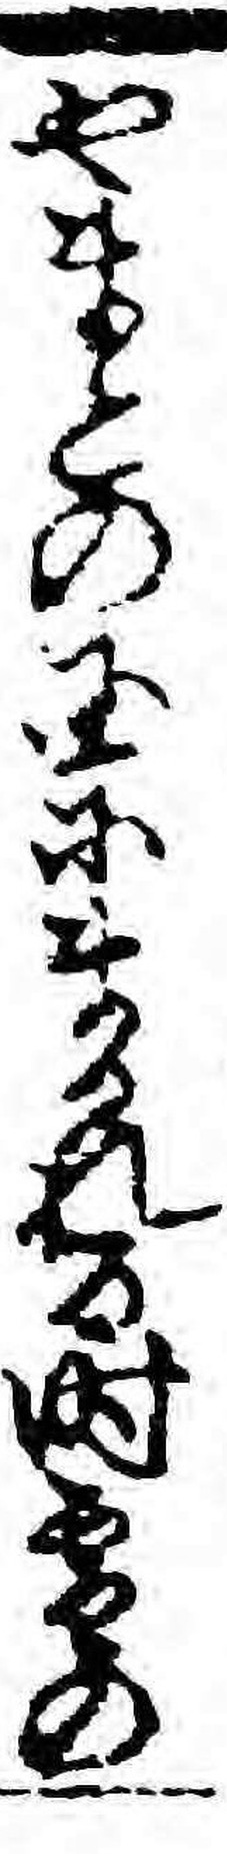やまとの国にまかれる時雪の
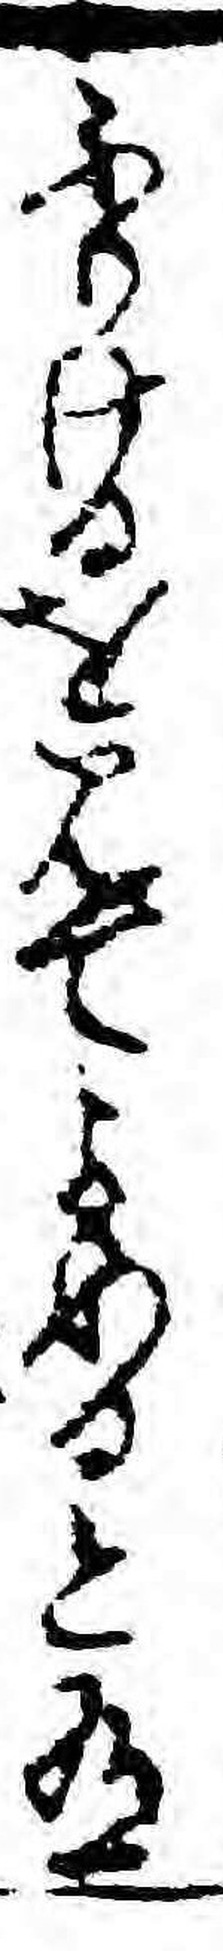ふりけるを見てよめると有
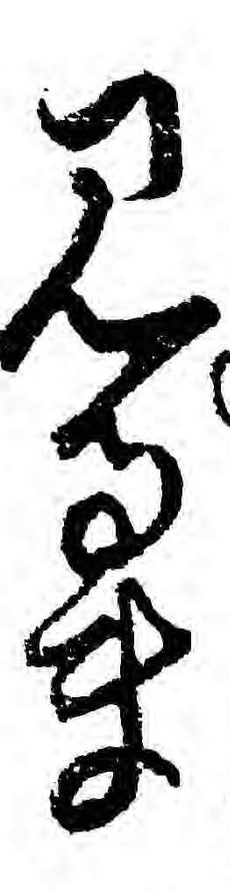見るま
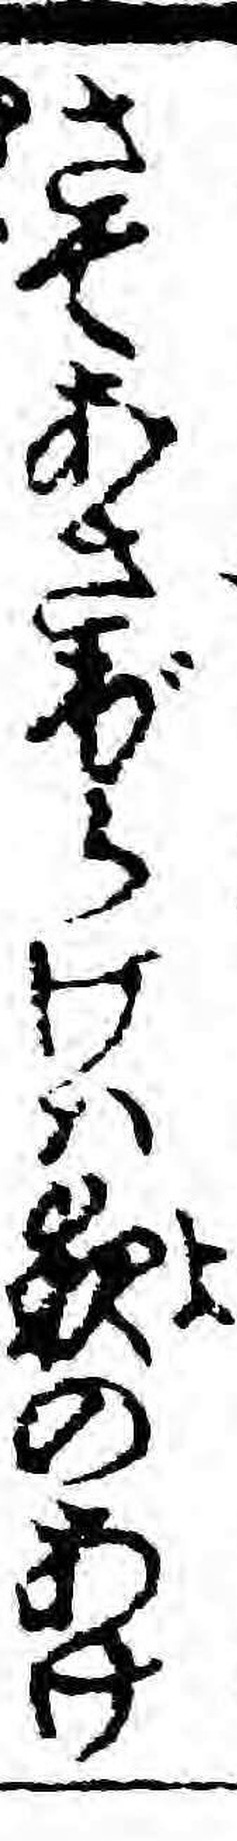さてあさぼらけは夜のあけ
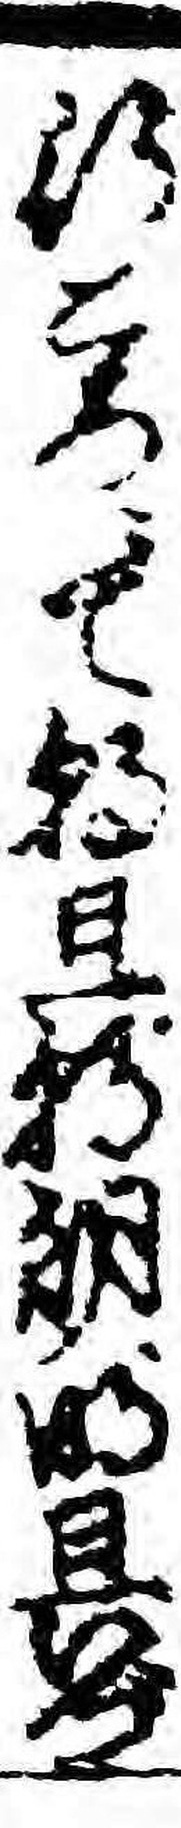行ころにて朝且朝朗明且いづ
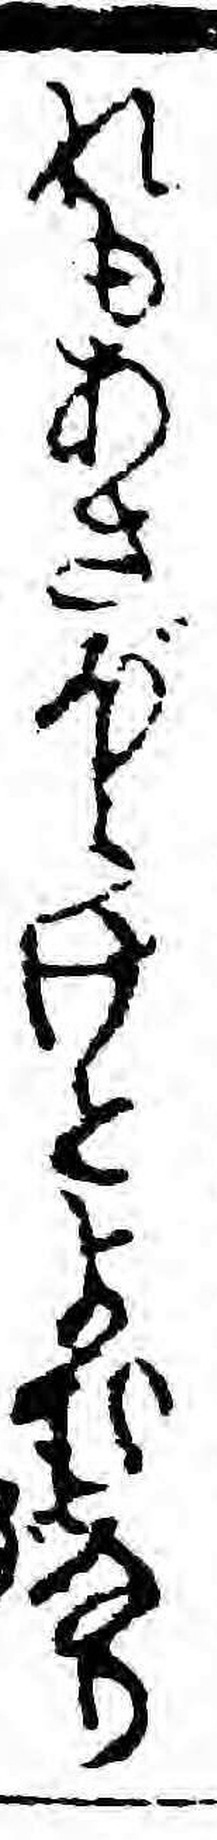れもあさぼらけとよむなり
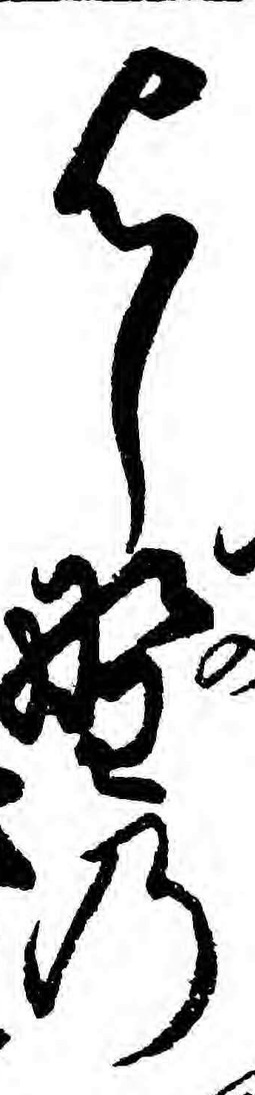よし野の
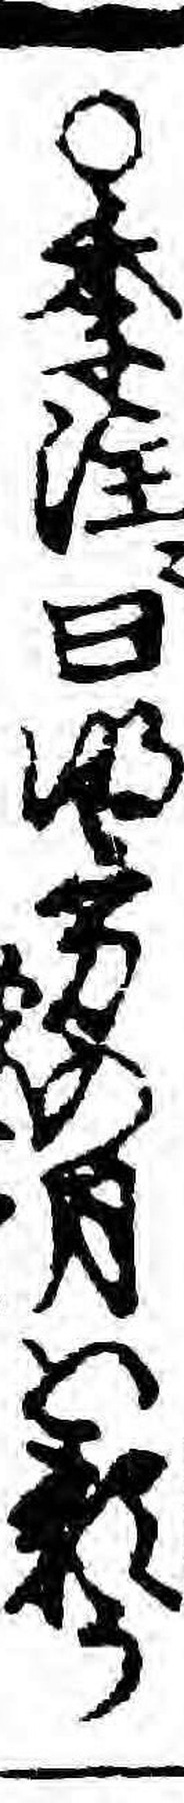〇季注に曰明方の月は影う
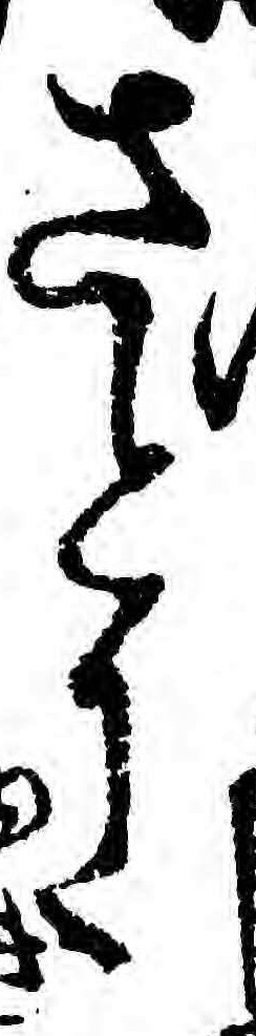さとに
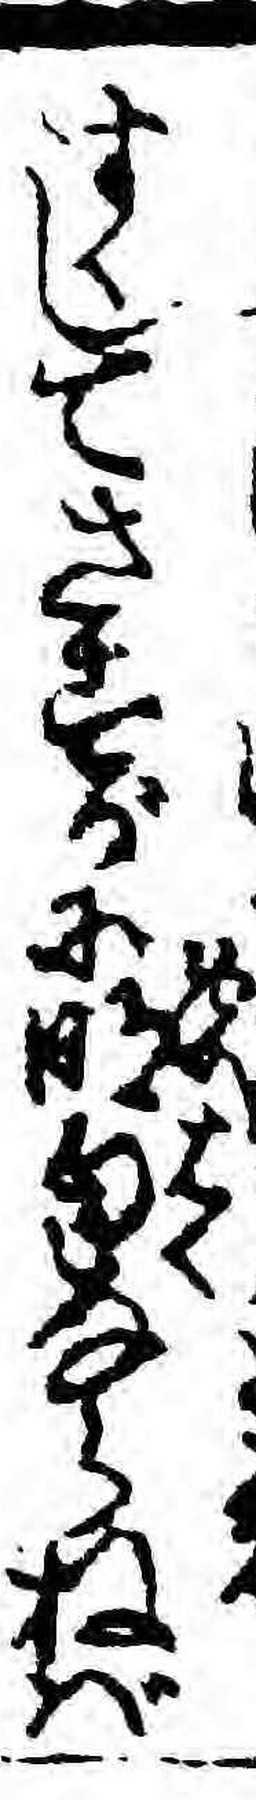すくしてさすがに明白ならねば
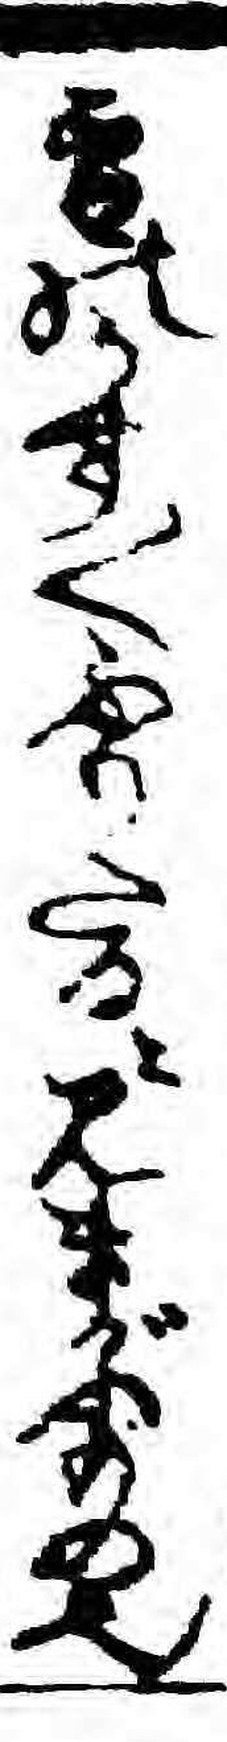雪のうすくふりたるに見まがふもの也

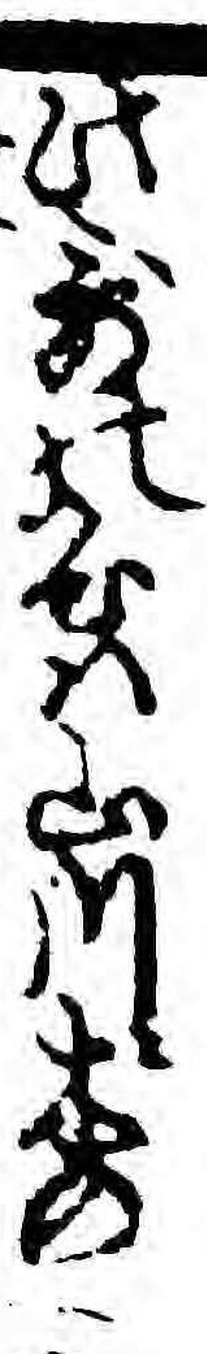此哥の心は山川に木の
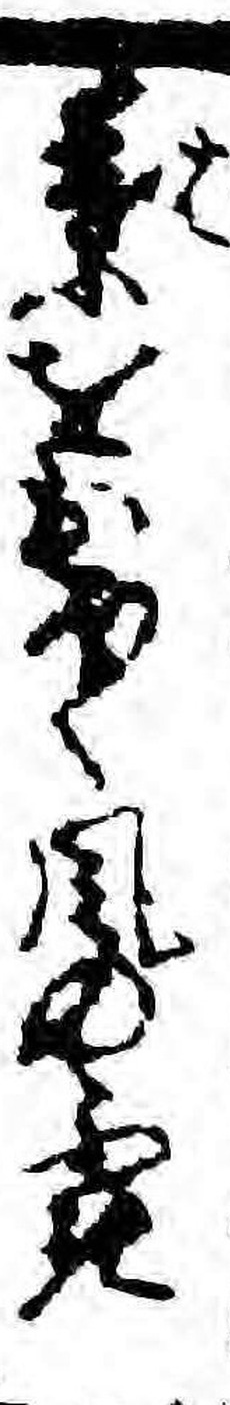葉をおほく風のふき
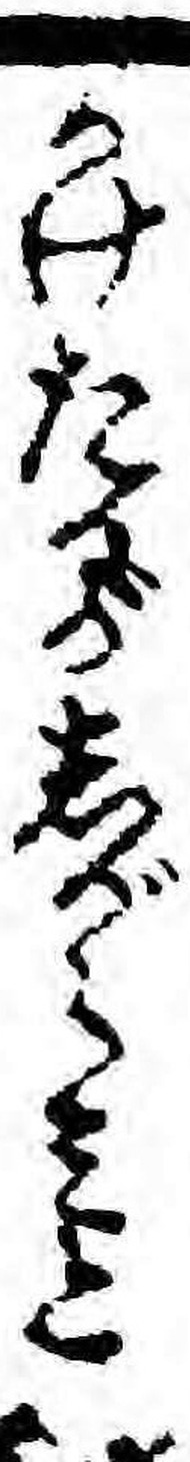かけたるがしがらみと
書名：頭書和歌注譯／壽賀多百人一首小倉錦
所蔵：国文学研究資料館
